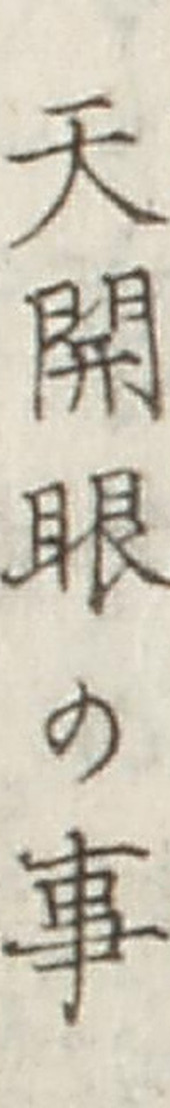天開眼の事
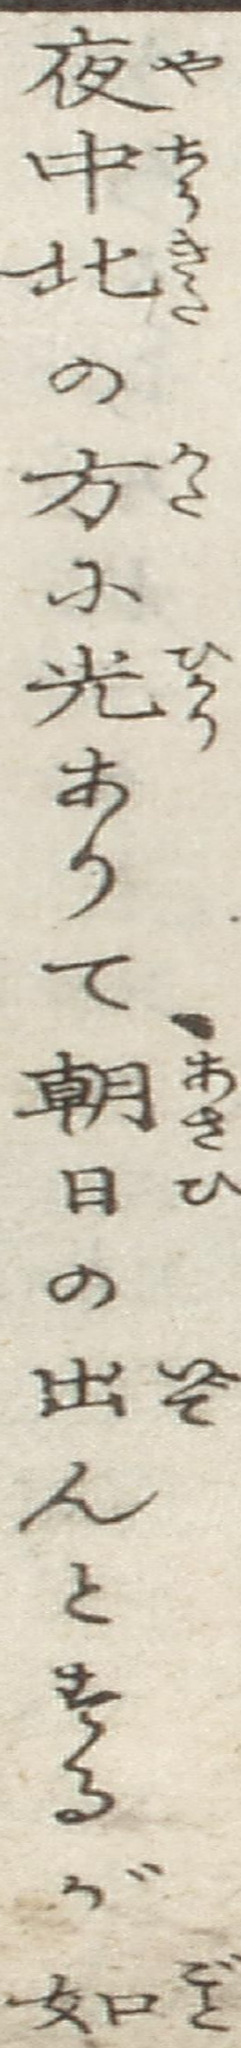夜中北の方に光ありて、朝日の出んとするが如
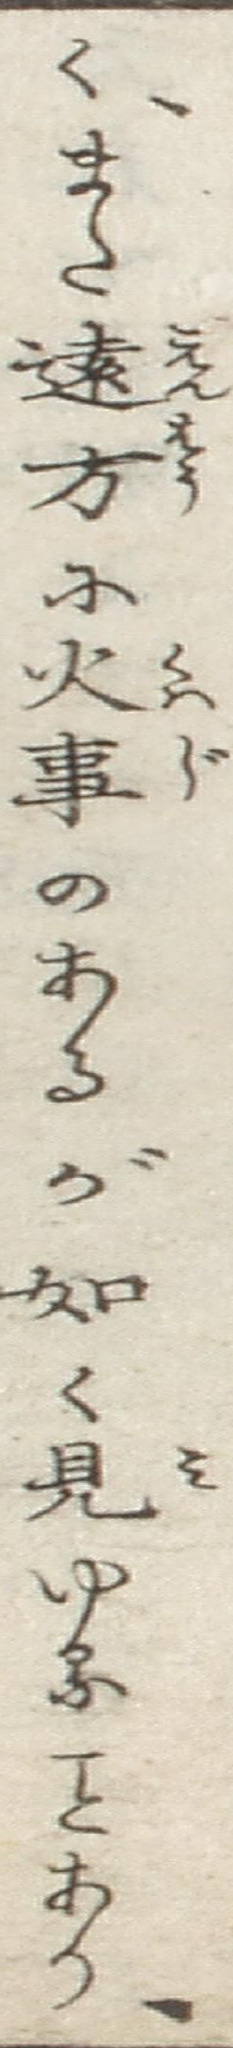く、また遠方に火事のあるが如く見ゆることあり、

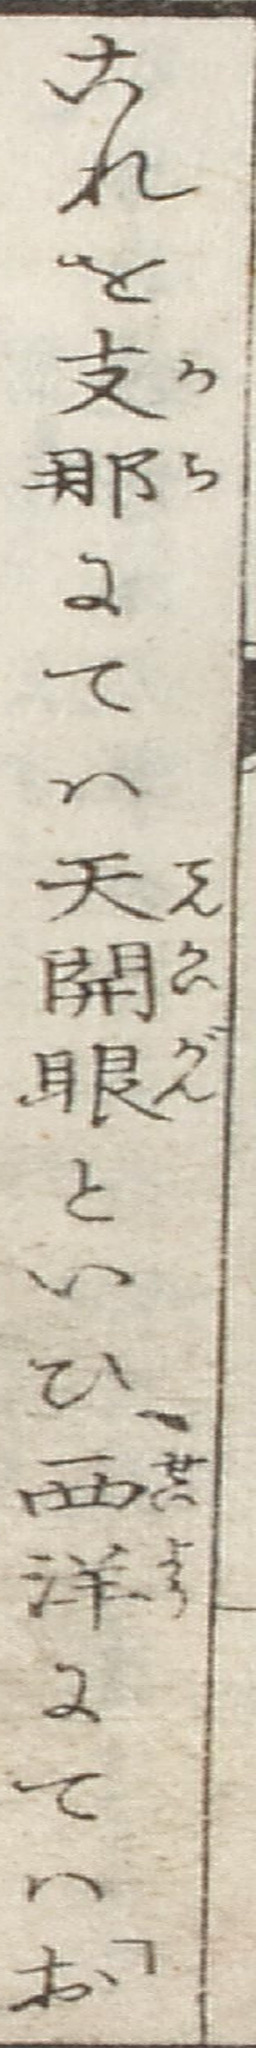これを支那にては天開眼といひ、西洋にては「お
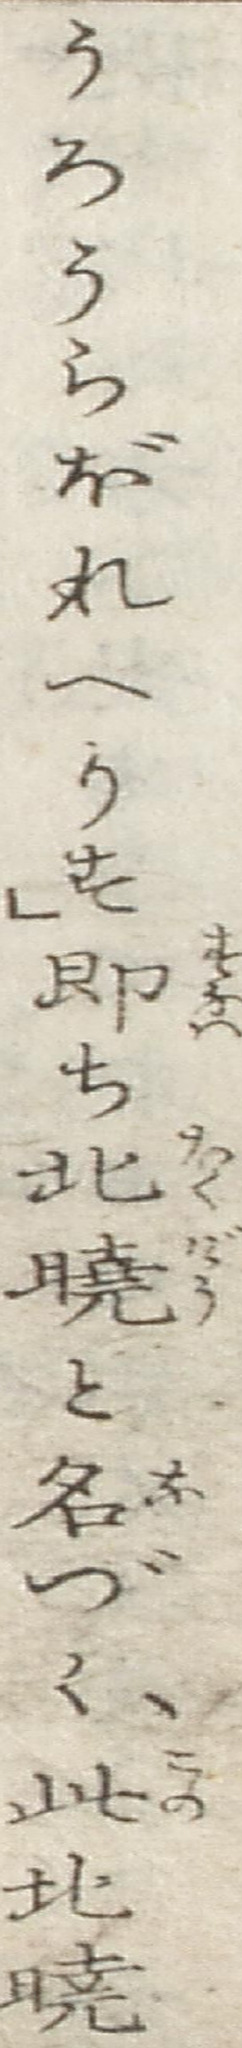うろうらぼれへりす」即ち北暁と名づく、此北暁
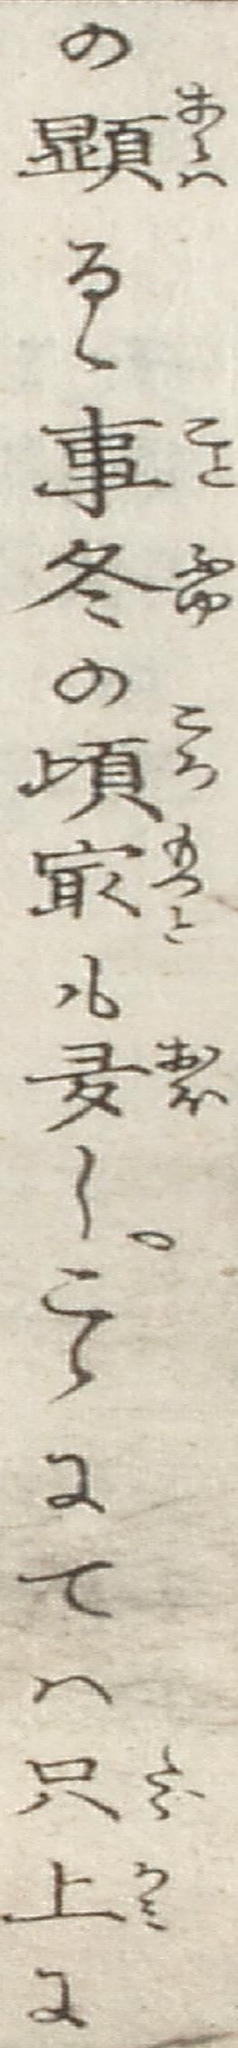の顕るゝ事冬の比最も多し。こゝにては只上に
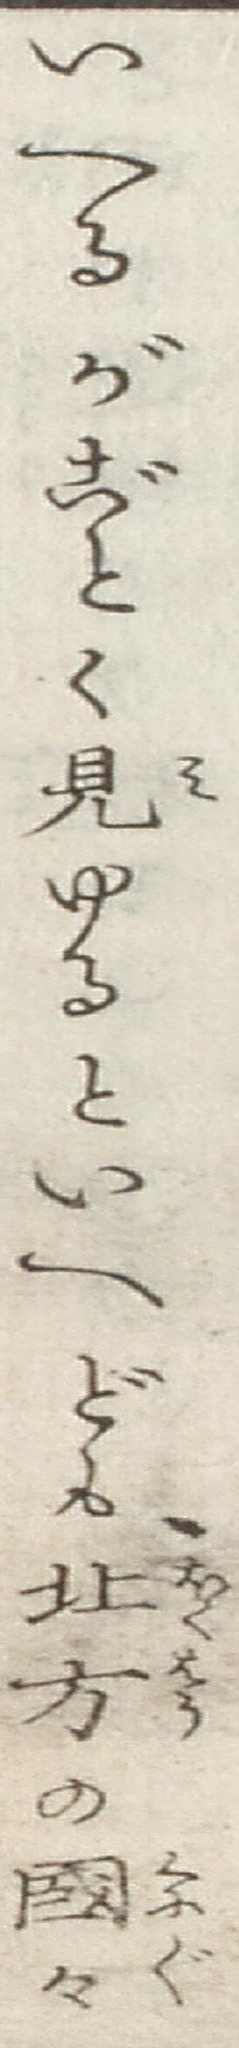いへるがごとく見ゆるといへども、北方の国々
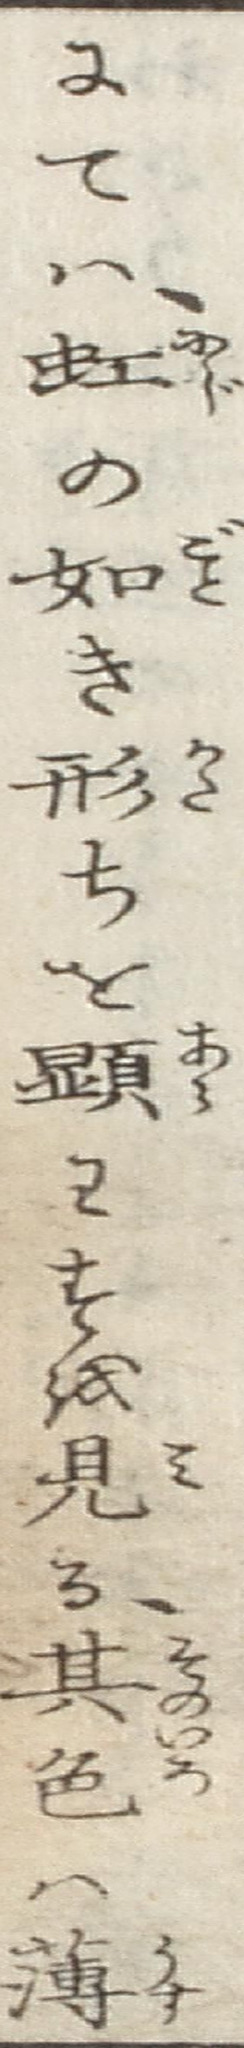にては、虹の如き形ちを顕わすを見る、其色は薄
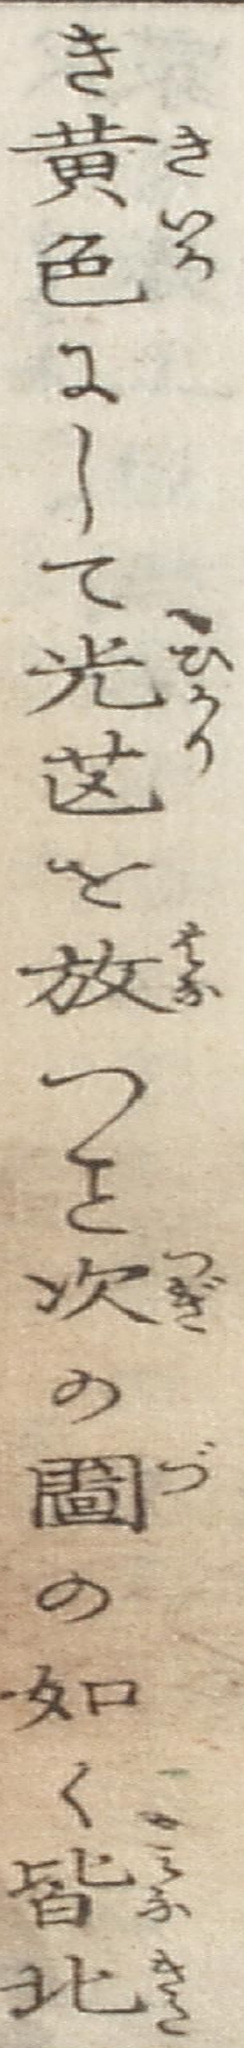き黄色にして、光芒を放つこと次の図の如く、皆北
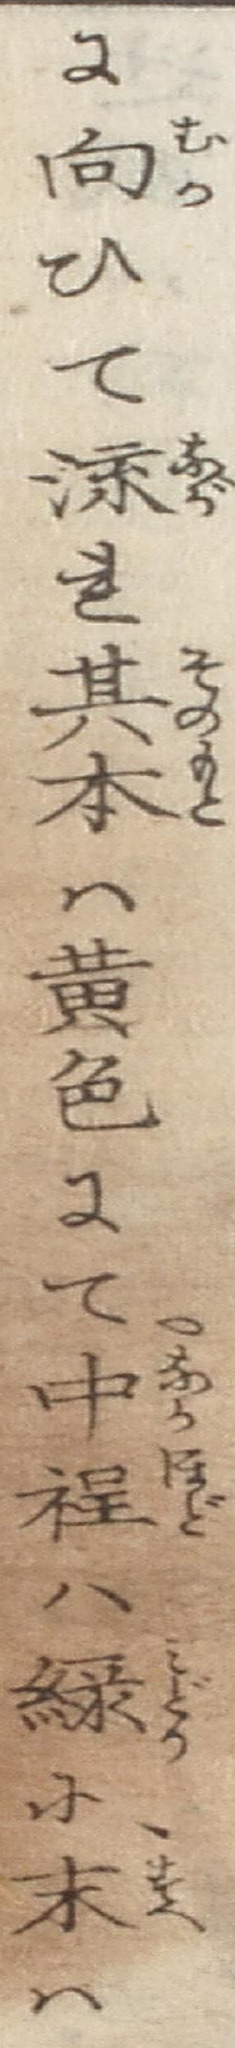に向ひて流れ其本は黄色にて。中程は緑に、末は
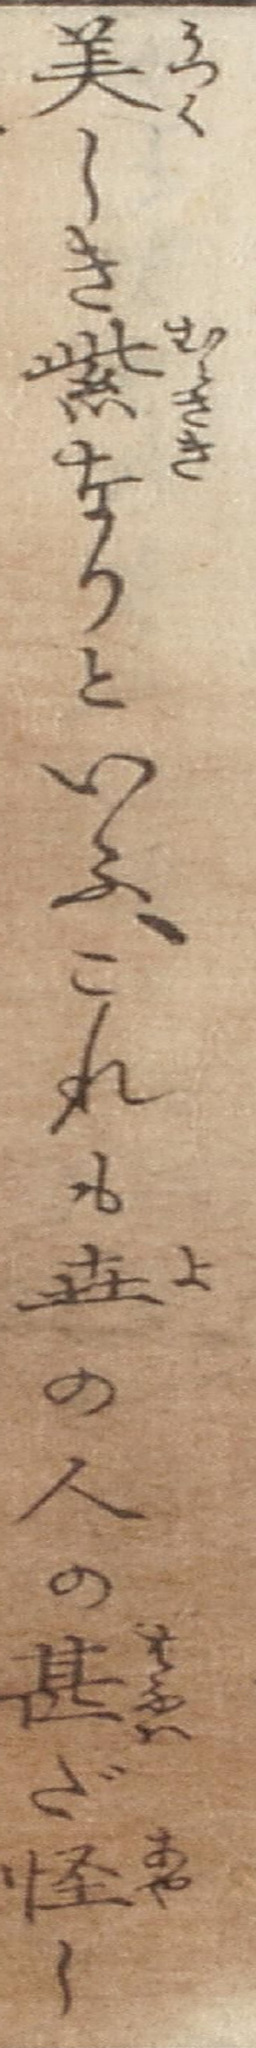美しき紫なりといふ、これも世の人の甚だ怪し
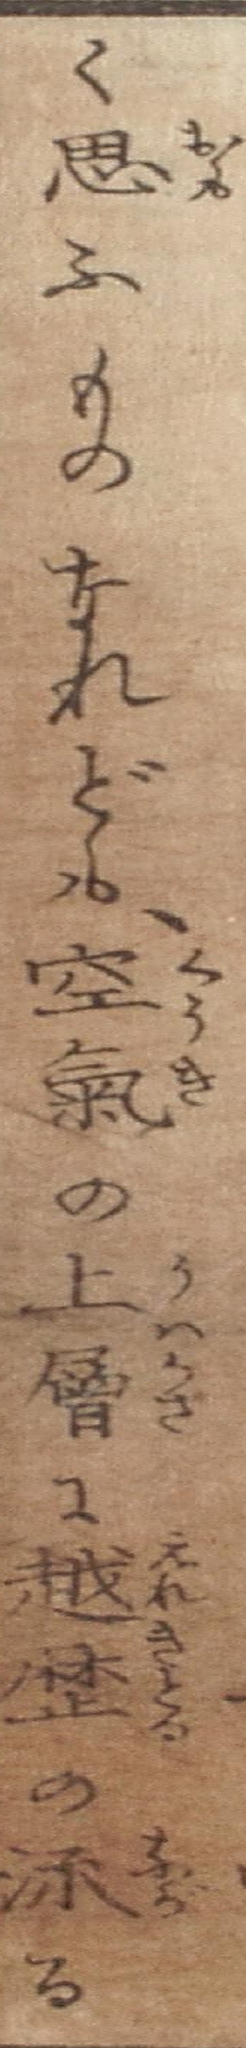く思ふものなれども、空気の上層に越歴の流る
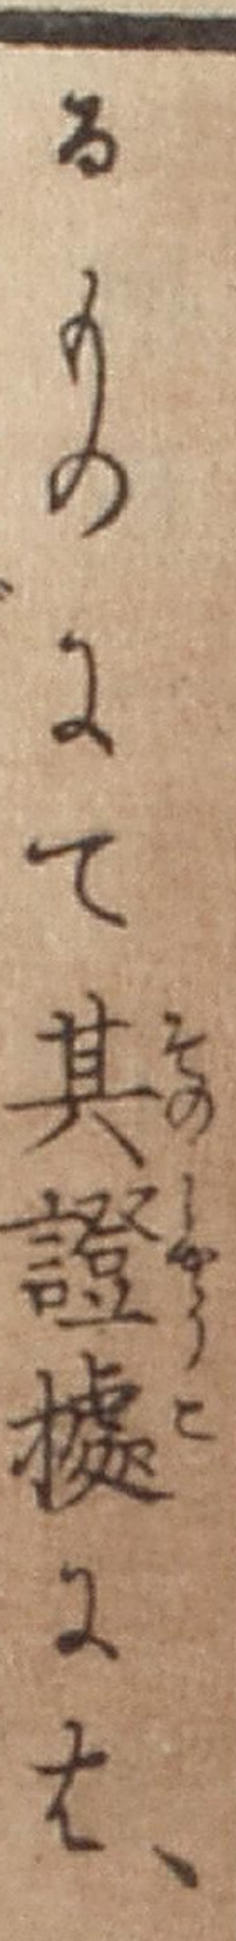るものにて其証拠には、
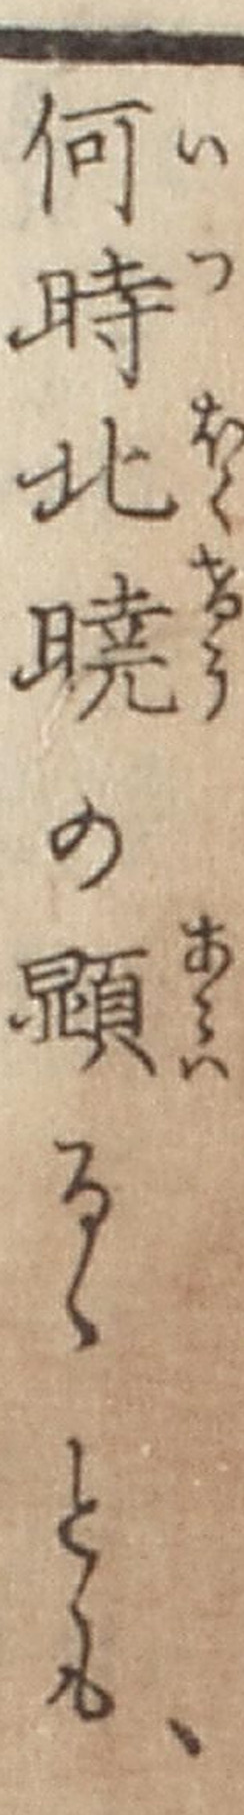何時北暁の顕るゝとも、
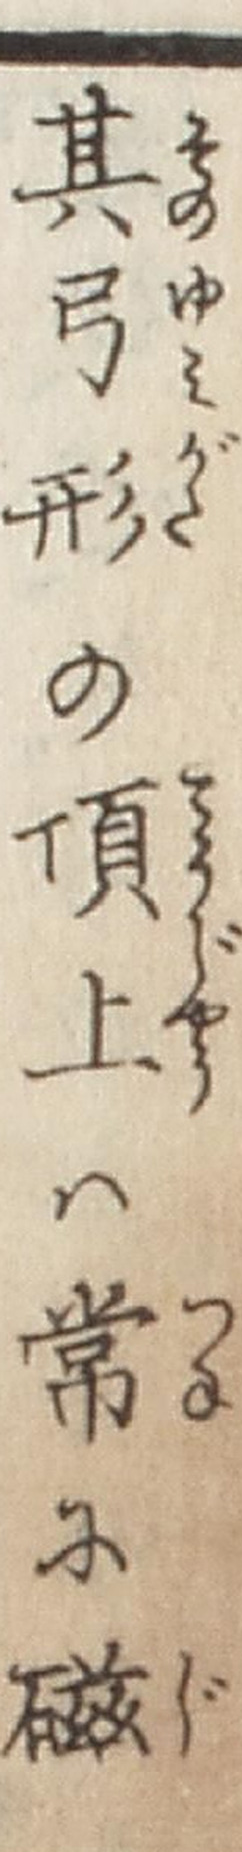其弓形の頂上は常に磁
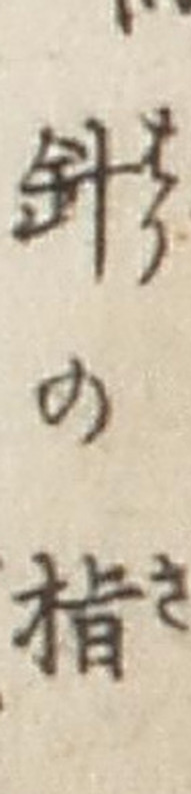針の指
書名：変異辯　一名、天變地異拾遺　全
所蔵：東京大学地震研究所図書室 Earthquake Research Institute Library, The University of Tokyo, JAPAN
